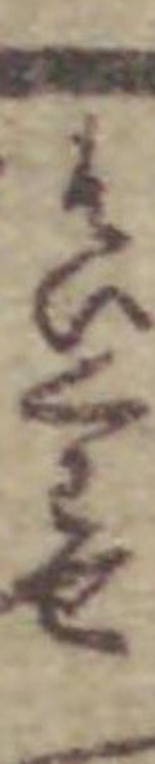はいくわせ
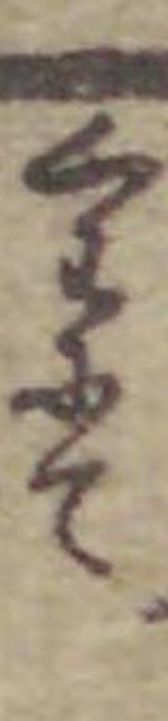くわにて
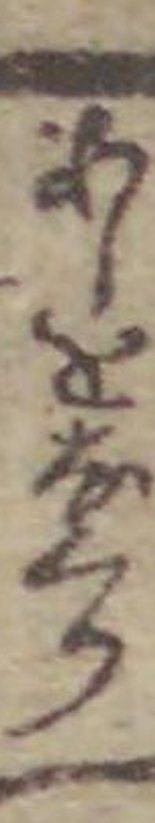あしをなくり
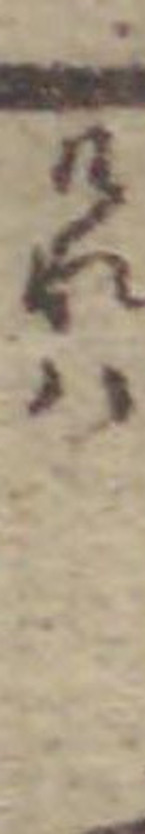けれハ
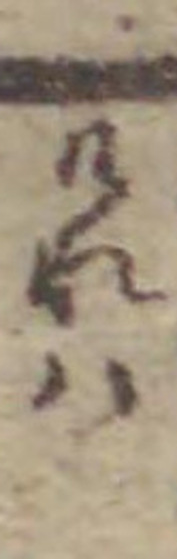けれハ
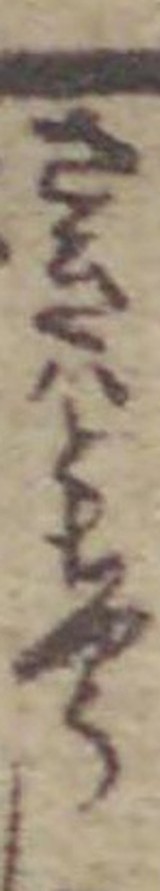さきはとちゆう
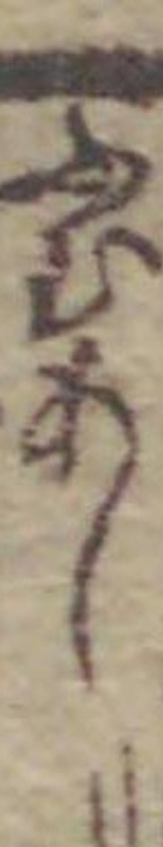ふむあし
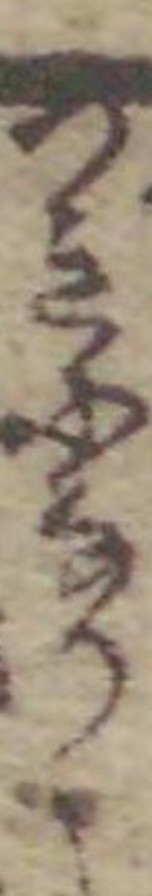つきになり
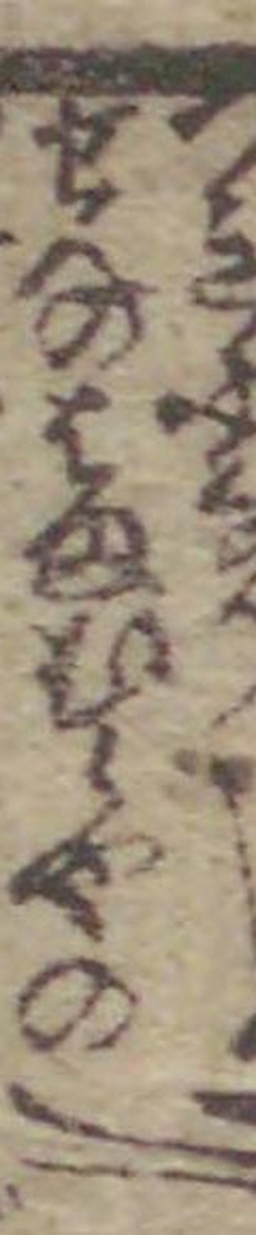せんのはまむらやの
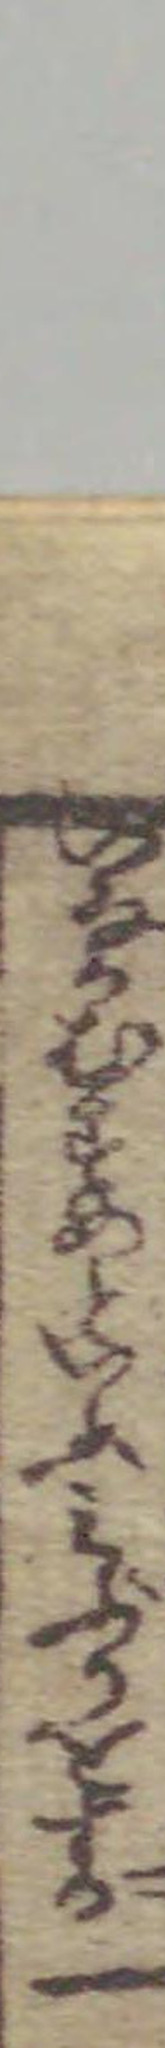いなかむすめといふミぶりをする
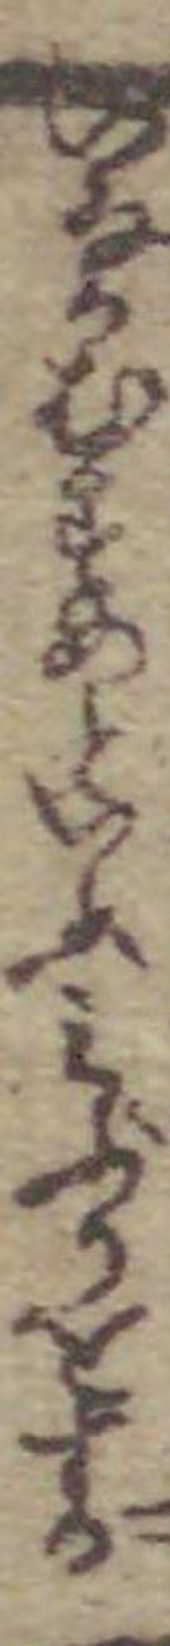いなかむすめといふミぶりをする

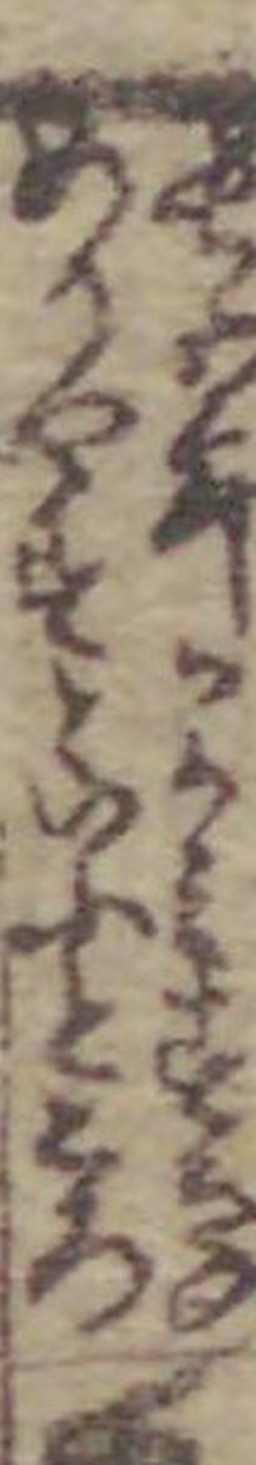めりやすといふところ
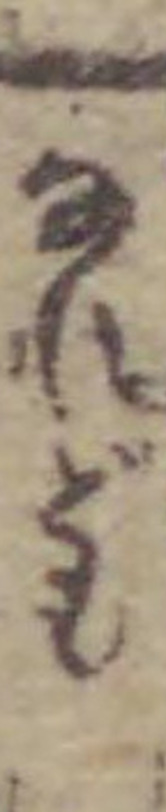なれども
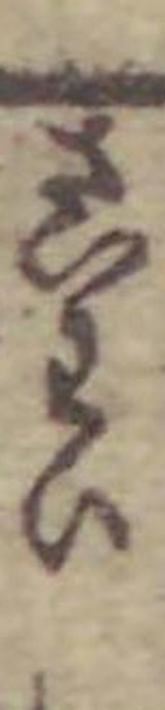さいわい
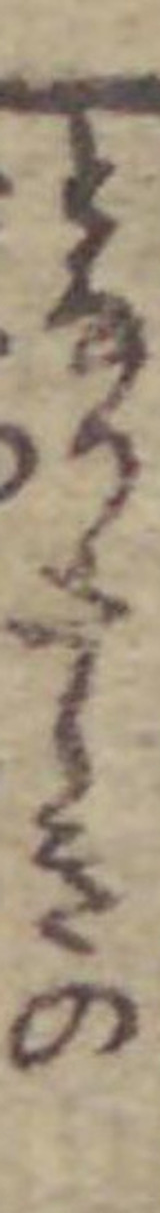となりさしきの
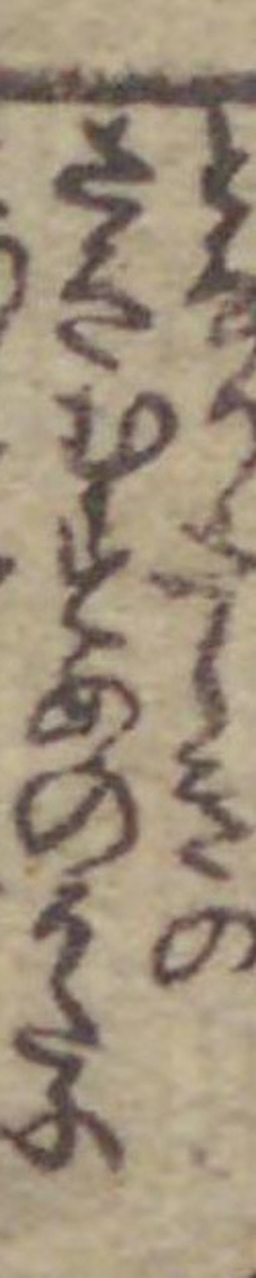さきむすめのうたに
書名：烏行水諺草 3巻
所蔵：国立国会図書館 National Diet Library, JAPAN
